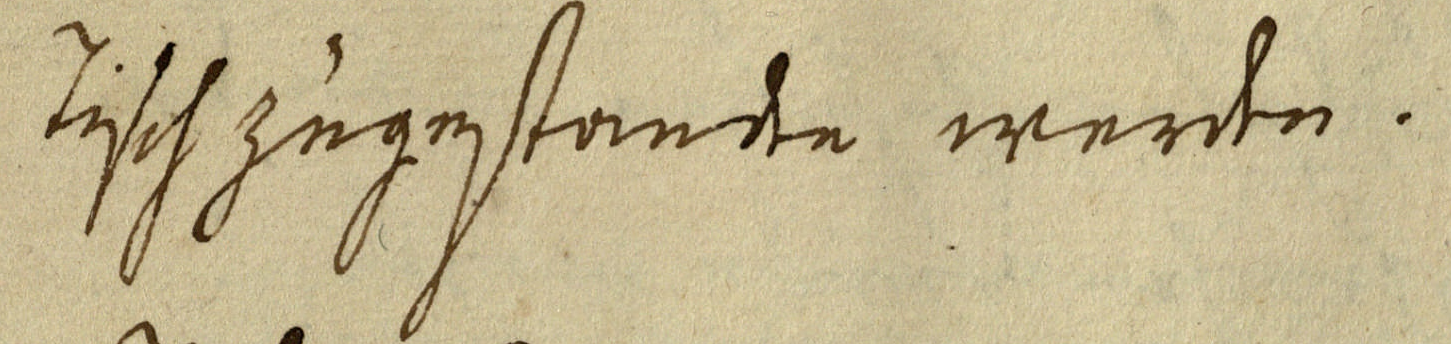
Tisch zugestanden werden.
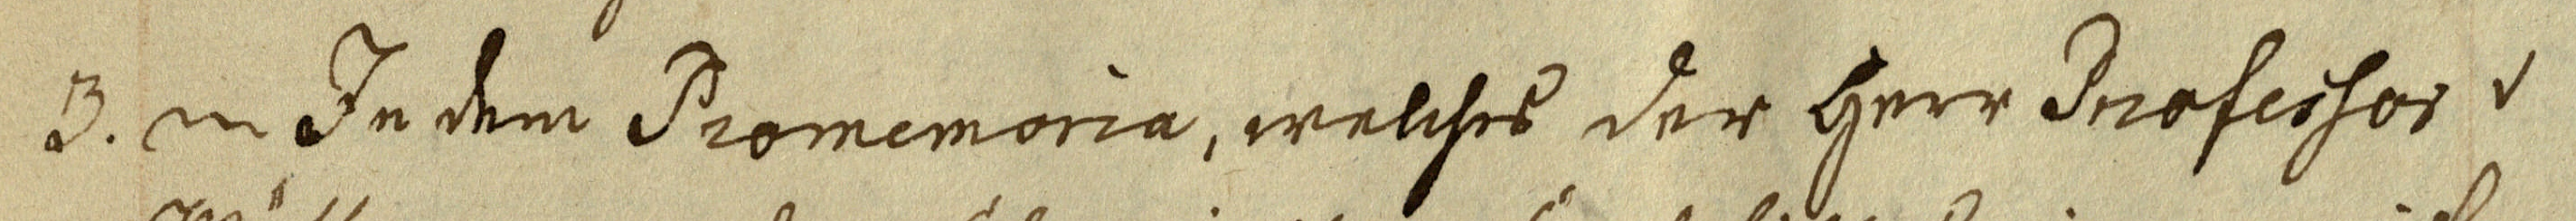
3. In dem Promemoria, welches der Herr Professor
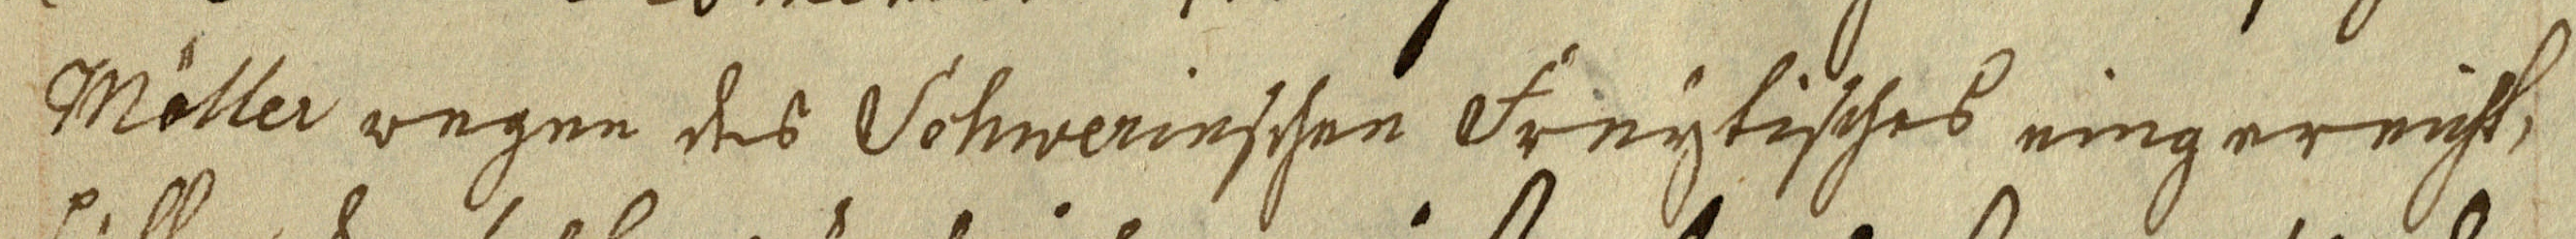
Möller wegen des Schwerinschen Freÿtisches eingereicht,
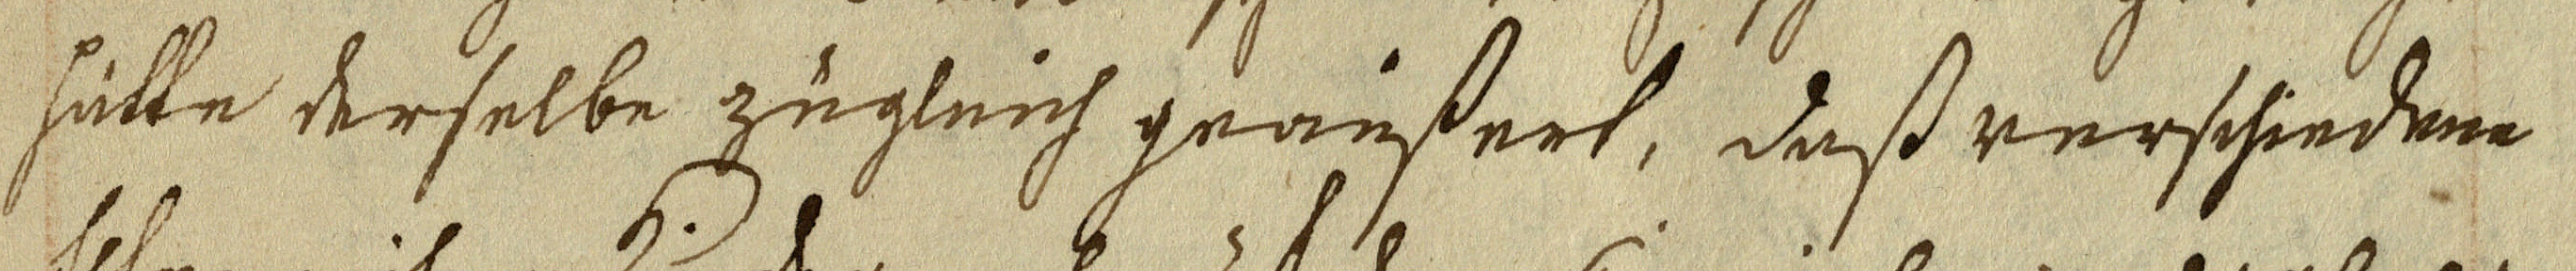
hätte derselbe zugleich geäußert, daß verschiedene
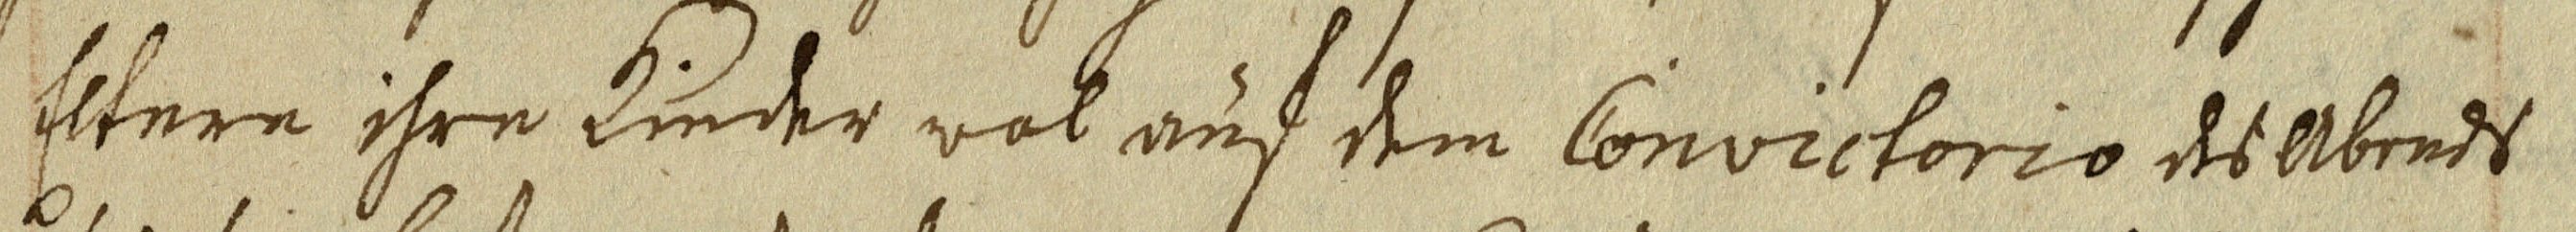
Eltern ihre Kinder wol auf dem Convictorio des Abends
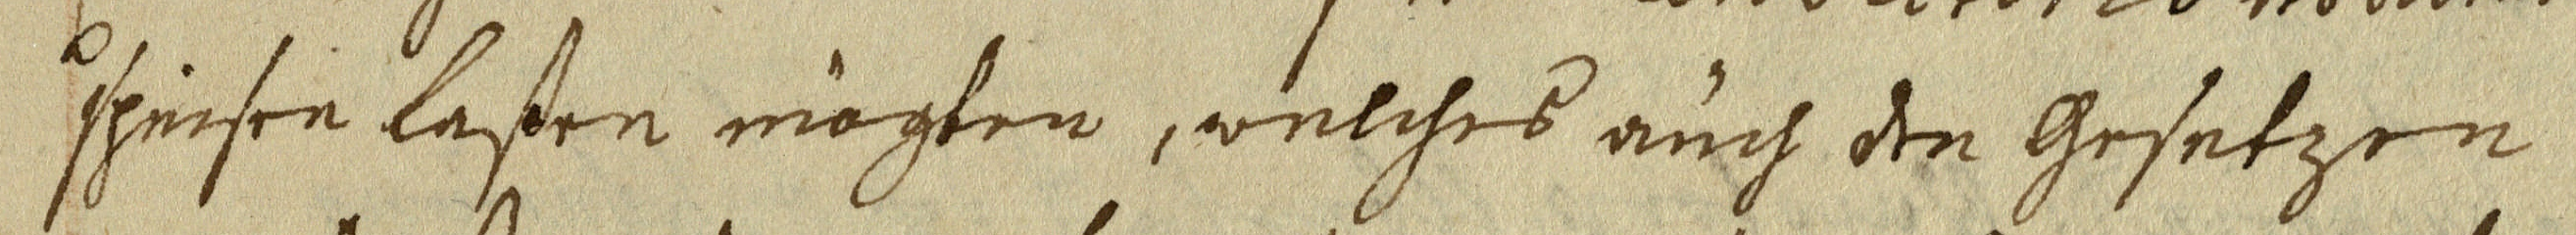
speisen laßen mögten, welches auch den Gesetzen
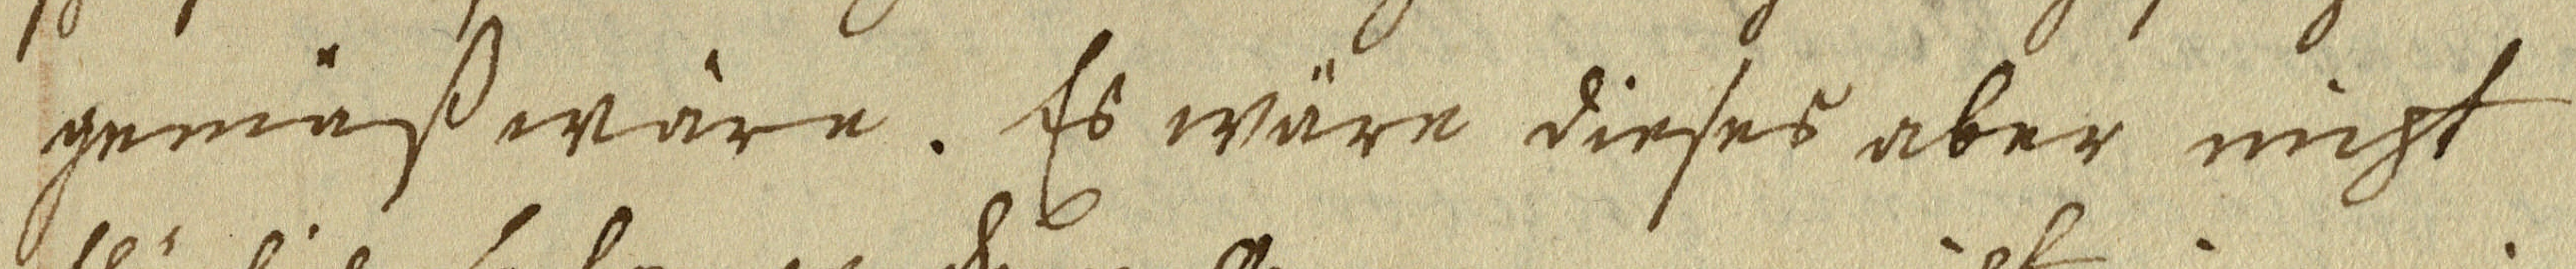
gemäß wäre. Es wäre dieses aber nicht
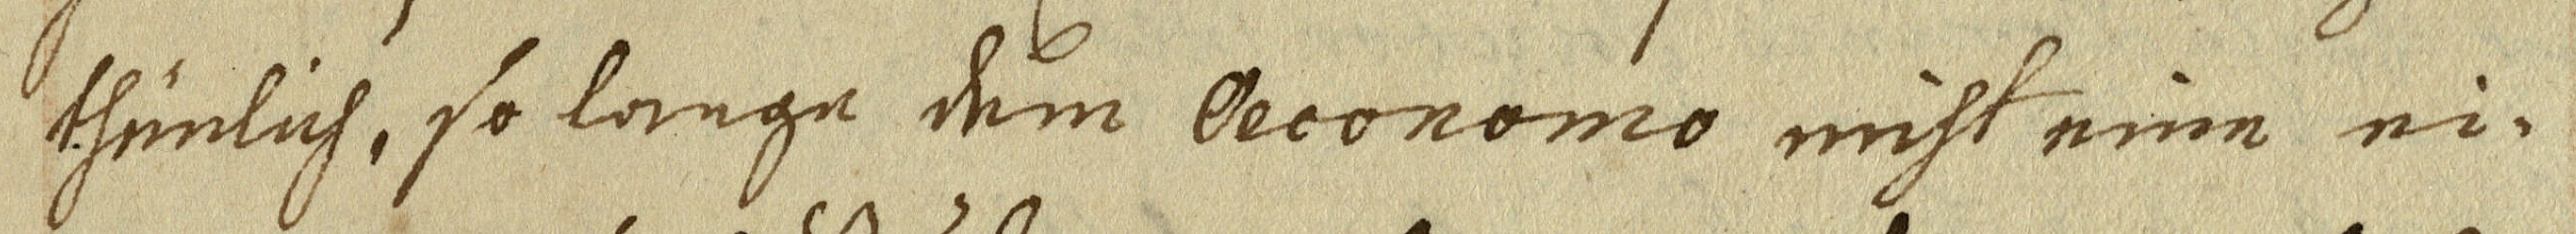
thunlich, so lange dem Oeconomo nicht eine ei¬
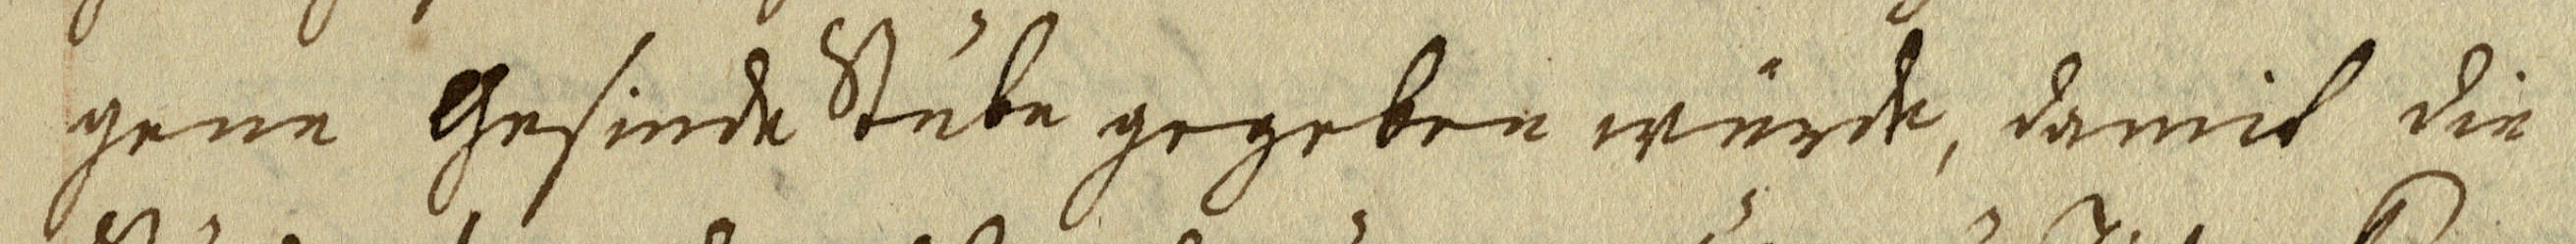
gene Gesinde Stube gegeben würde, damit die
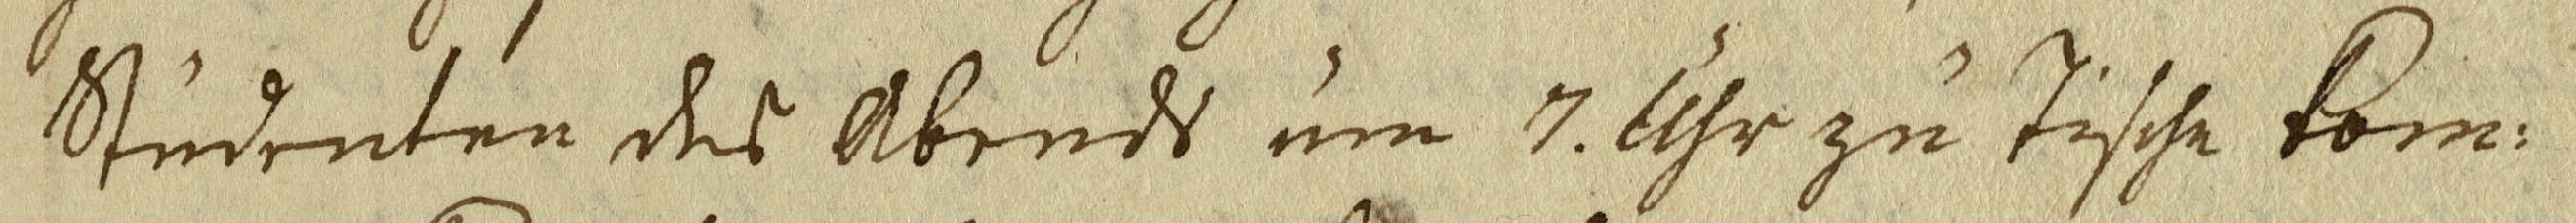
Studenten des Abends um 7. Uhr zu Tische kom¬
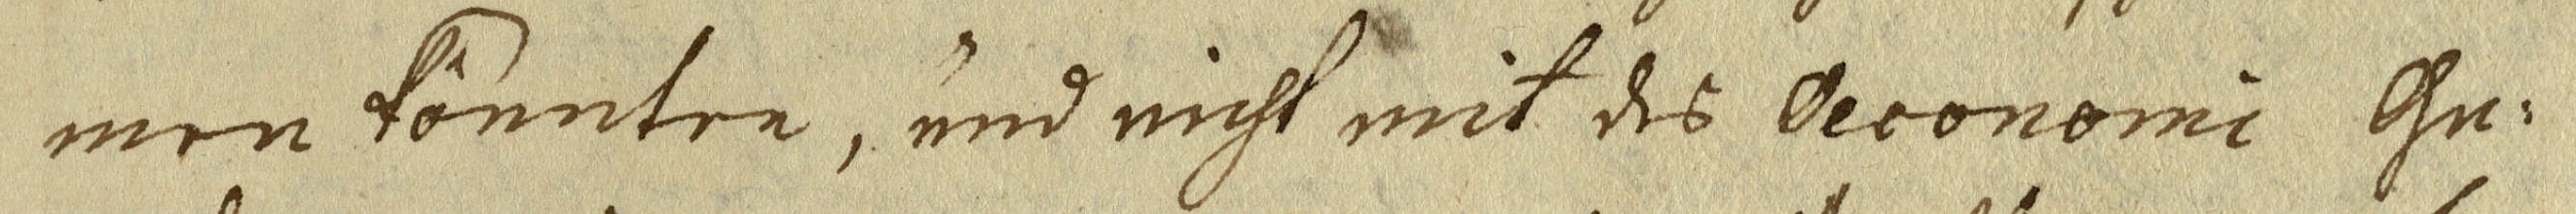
men könnten, und nicht mit des Oeconomi Ge¬
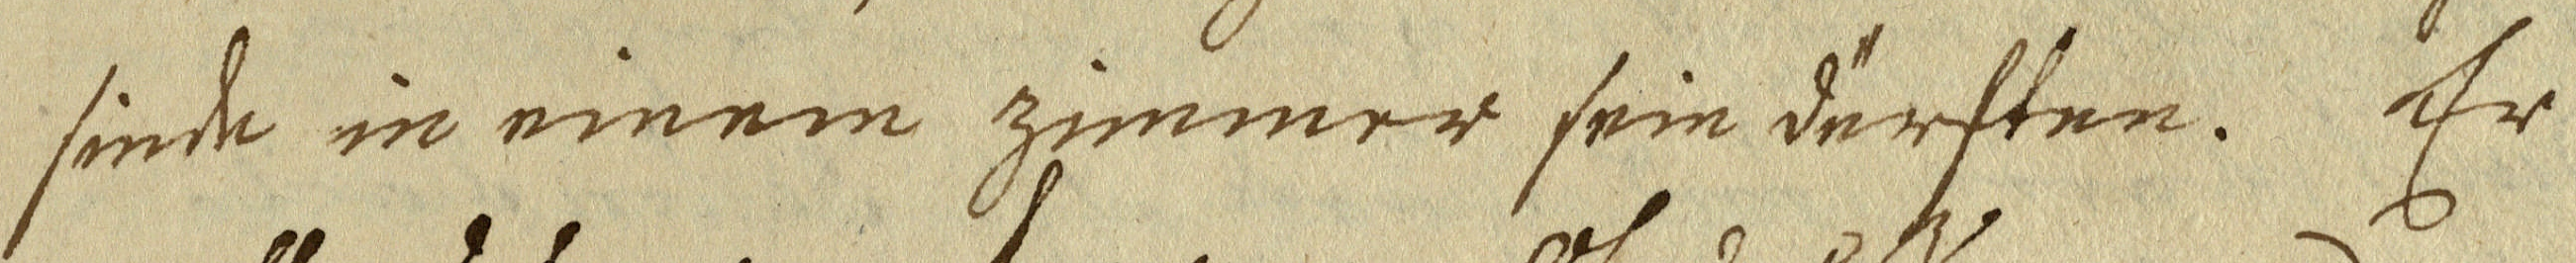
sinde in einem Zimmer sein dürften. Er
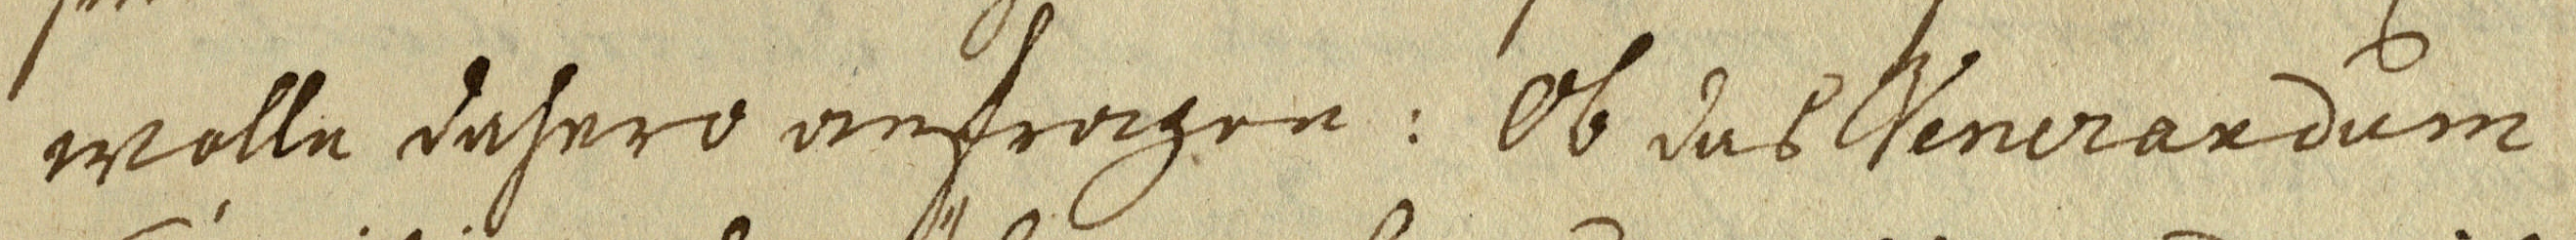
wolle dahero anfragen: Ob das Venerandum
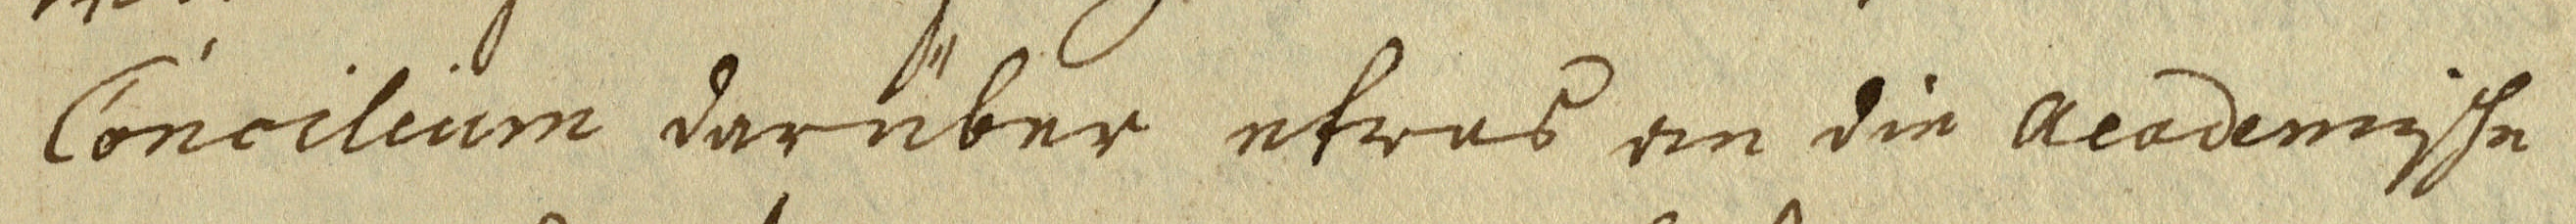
Concilium darüber etwas an die Academische
